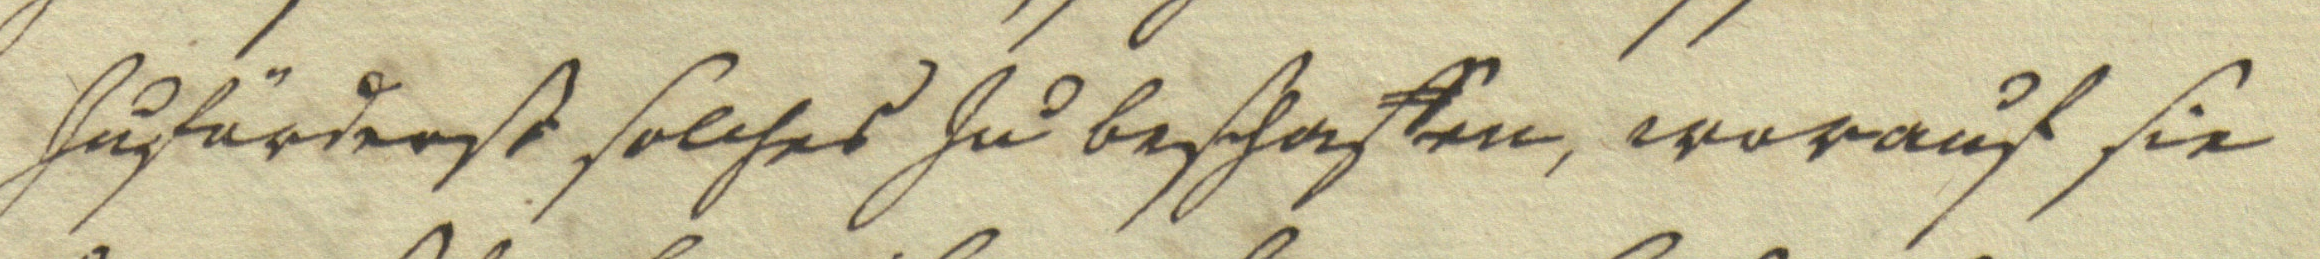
zuförderst solches zu beschaffen, worauf sie
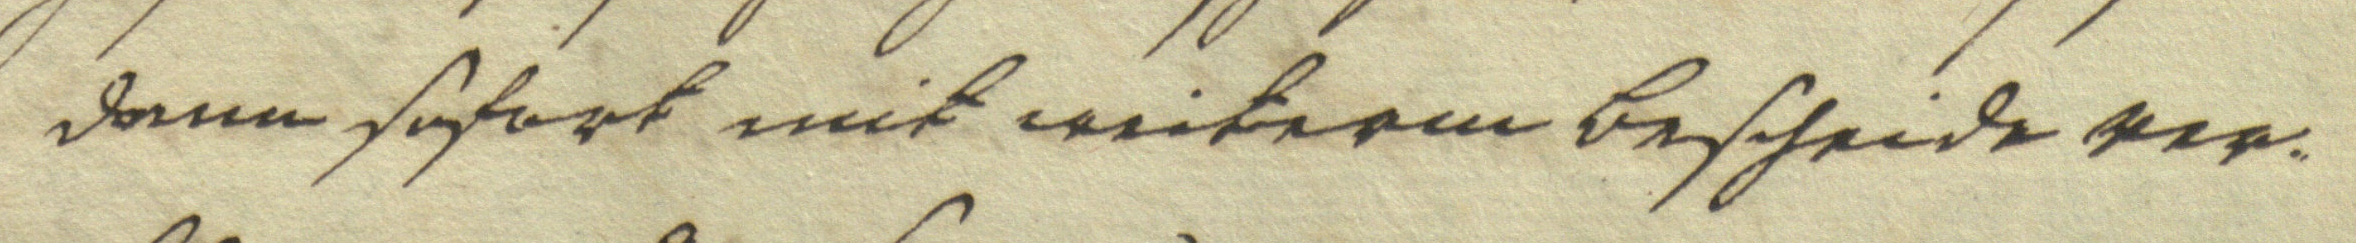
dann sofort mit weiterm Bescheide ver¬
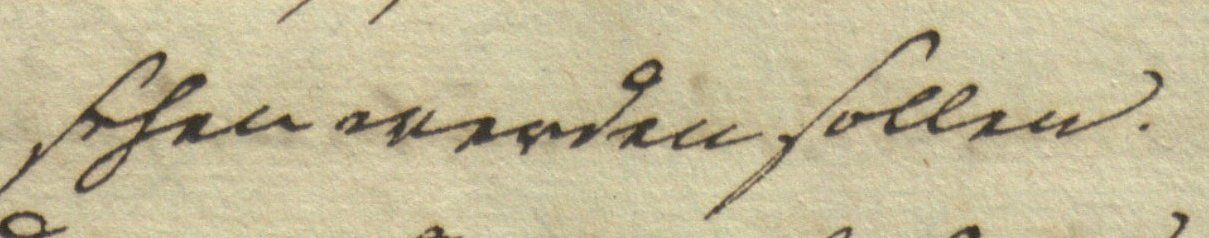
sehen werden sollen.
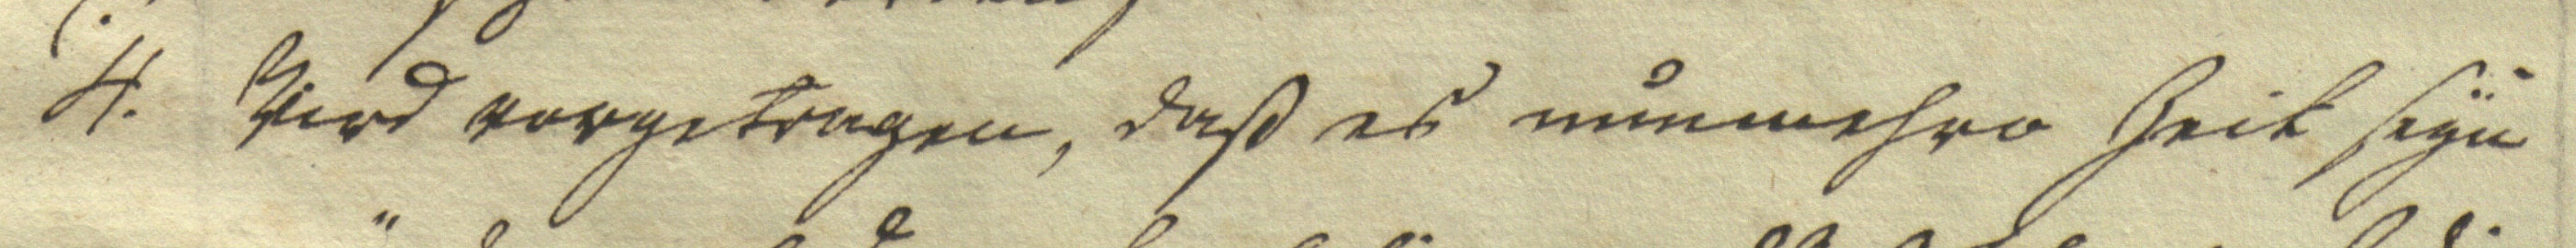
4. Wird vorgetragen, daß es nunmehro Zeit seÿn
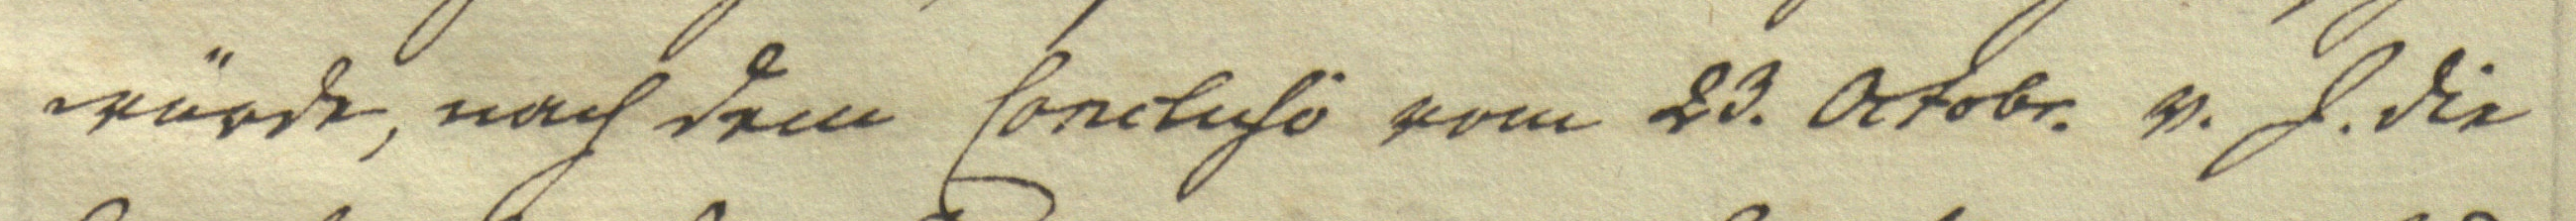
würde, nach dem Concluso vom 23. Octobr. v. J. die
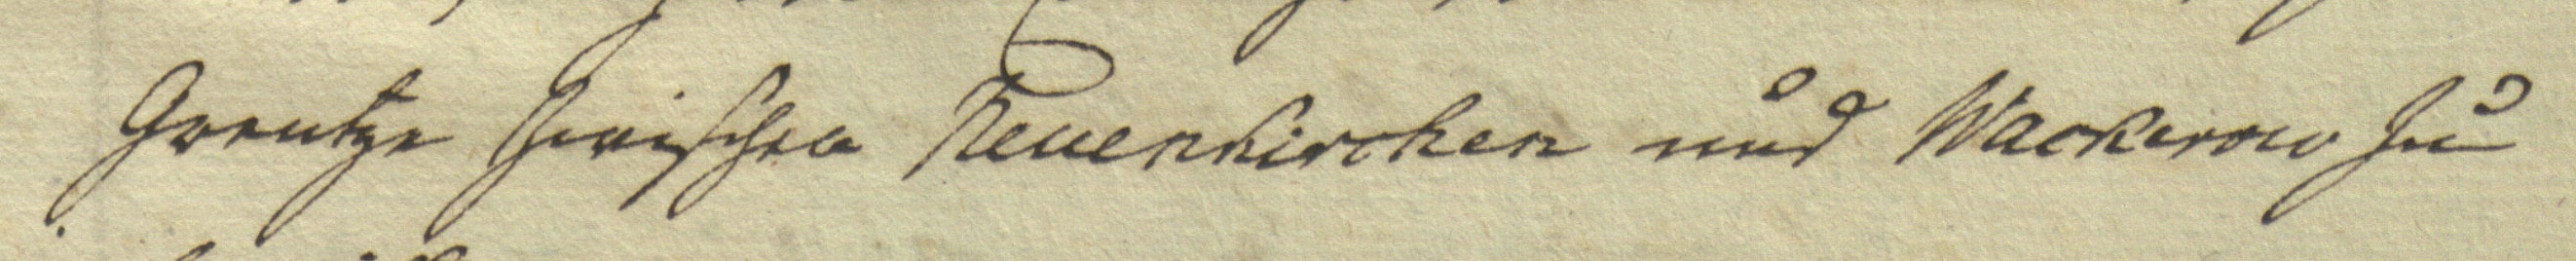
Grentze zwischen Neuenkirchen und Wackerow zu
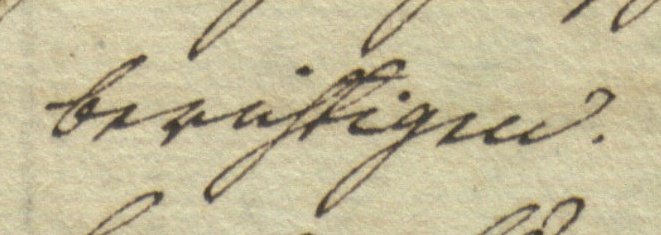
berichtigen.
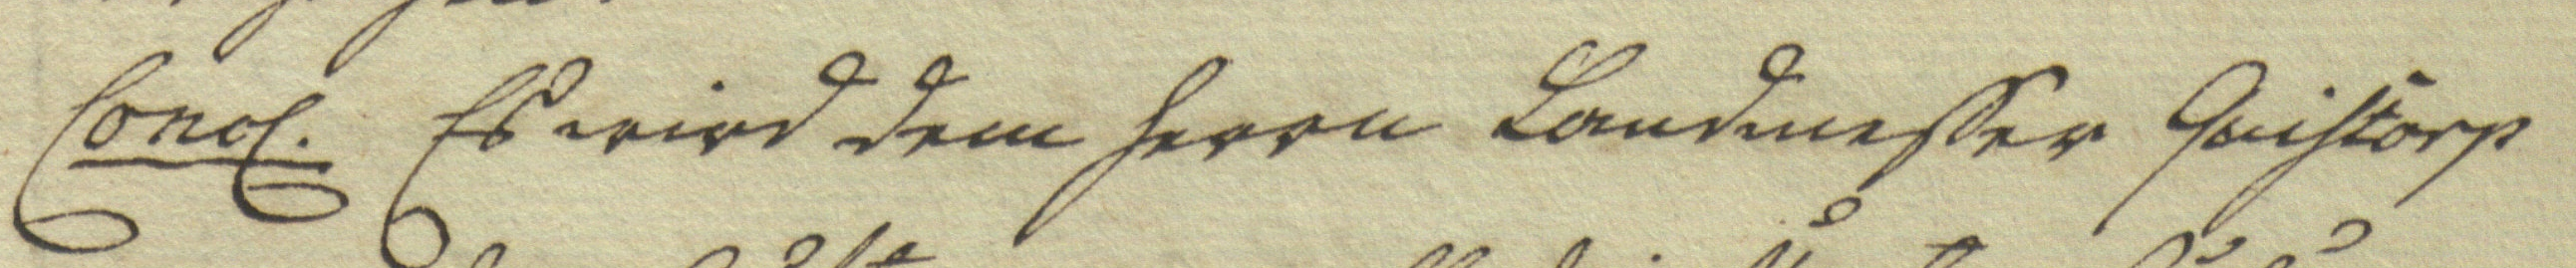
Concl. Es wird dem Herrn Landmesser Quistorp
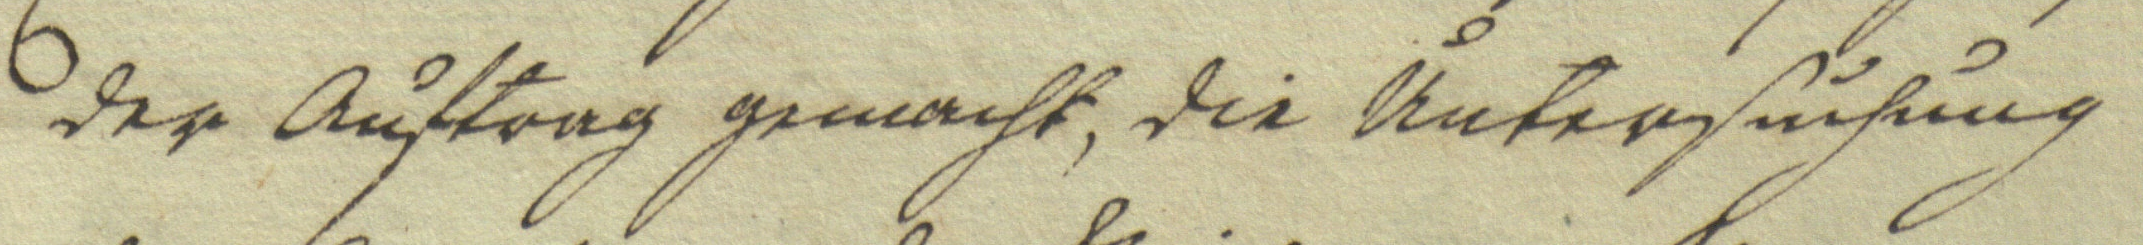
der Auftrag gemacht, die Untersuchung
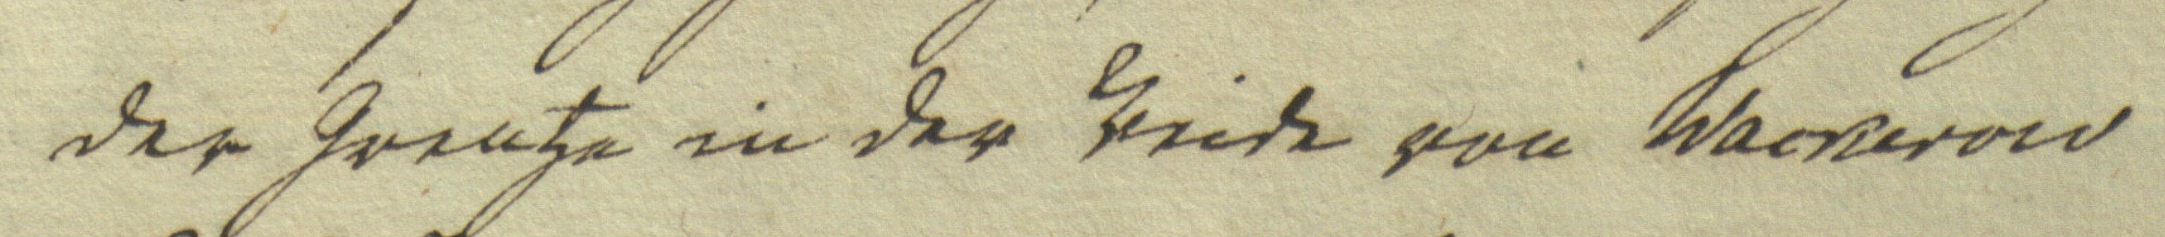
der Grentze in der Weide von Wackerow
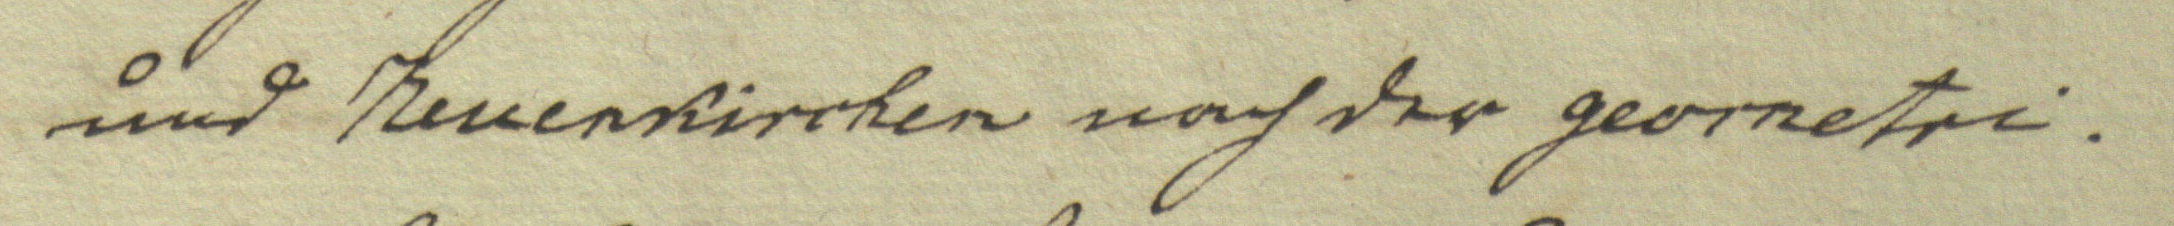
und Neuenkirchen nach der geometri¬
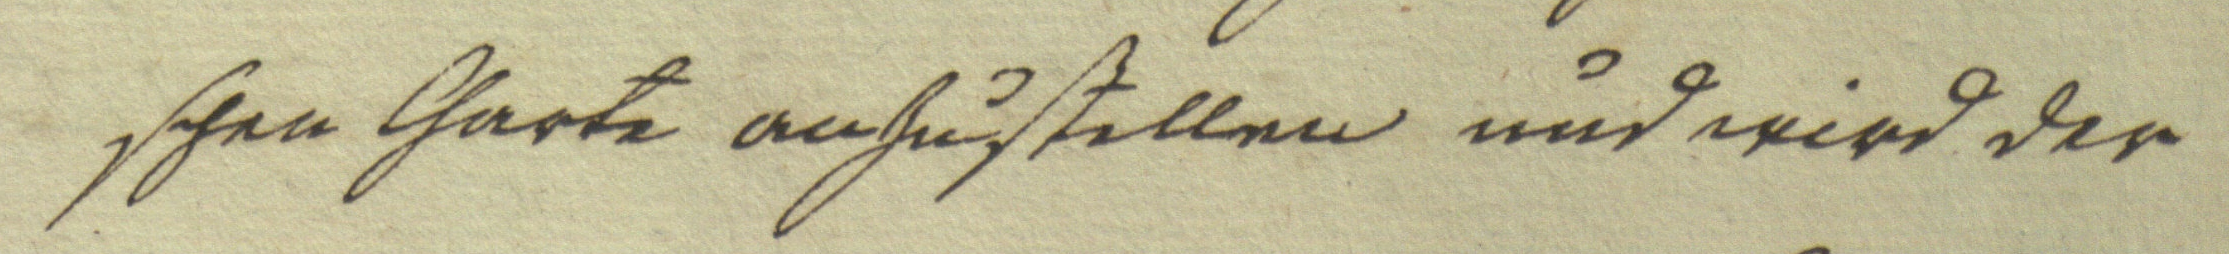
schen Charte anzustellen und wird der
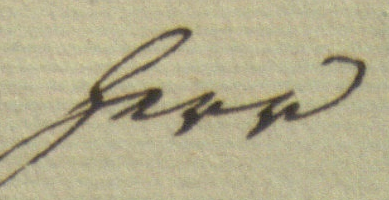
Herr
